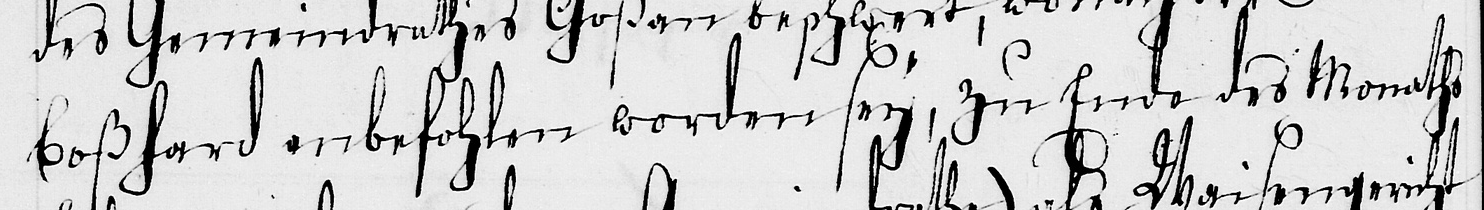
Boßhard anbefohlen worden sey, zu Ende des Monaths
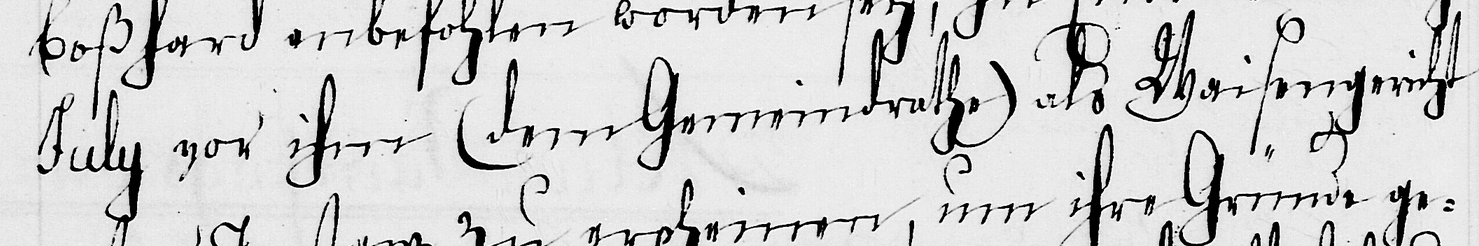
July vor ihm (dem Gemeindrathe) als Waisengericht
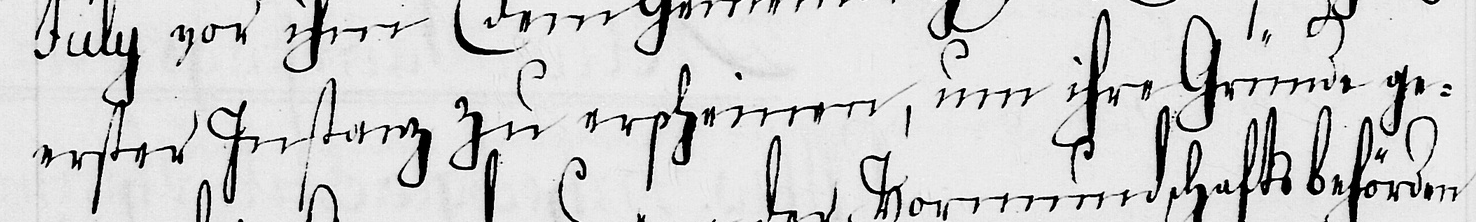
erster Instanz zu erscheinen, um ihre Gründe ge¬
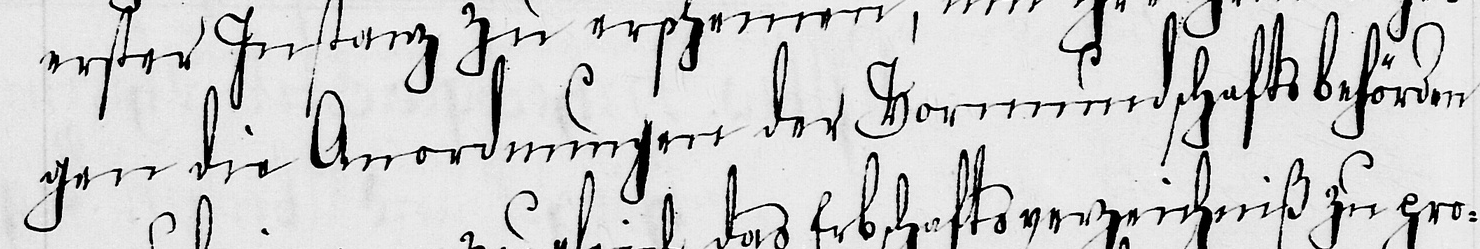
gen die Anordnungen der Vormundschaftsbehörd¬
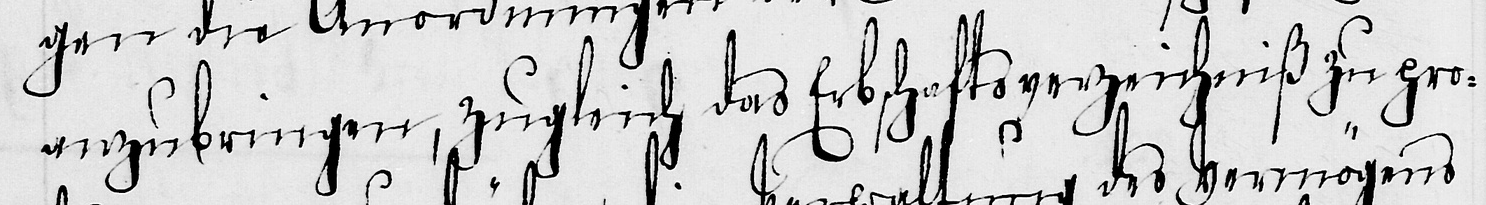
anzubringen, zugleich das Erbschaftsverzeichniß zu pro¬
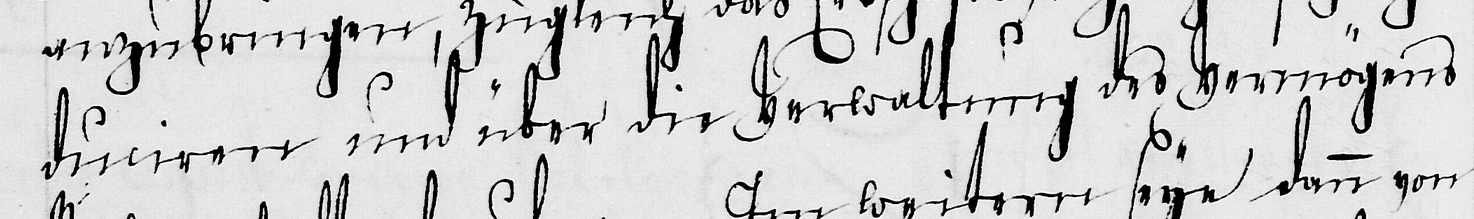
duciren und über die Verwaltung des Vermögens
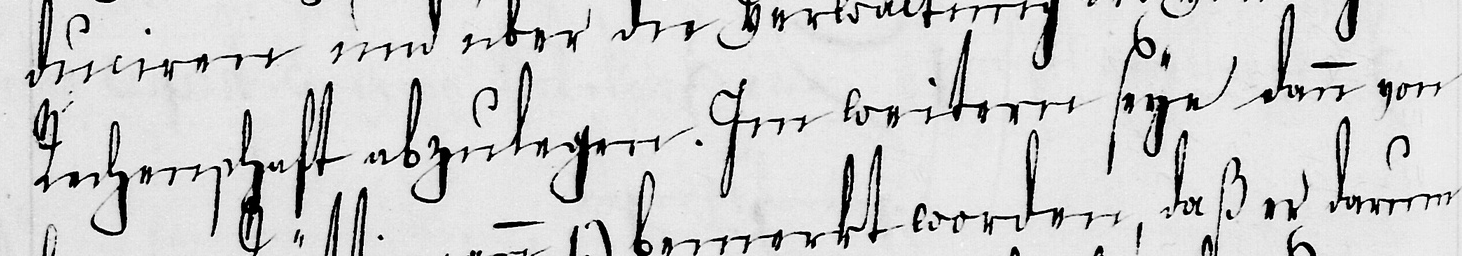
Rechenschaft abzulegen. Im weitern seye dann von
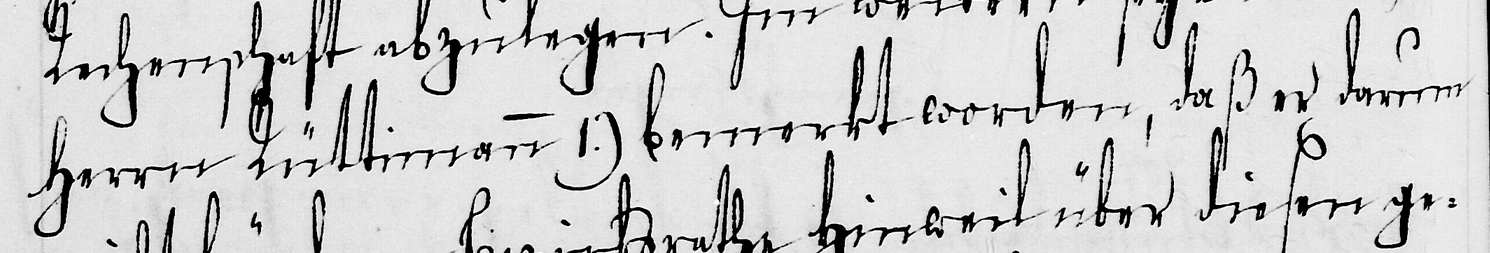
Herrn Rüttimann 1.) bemerkt worden, daß er darum
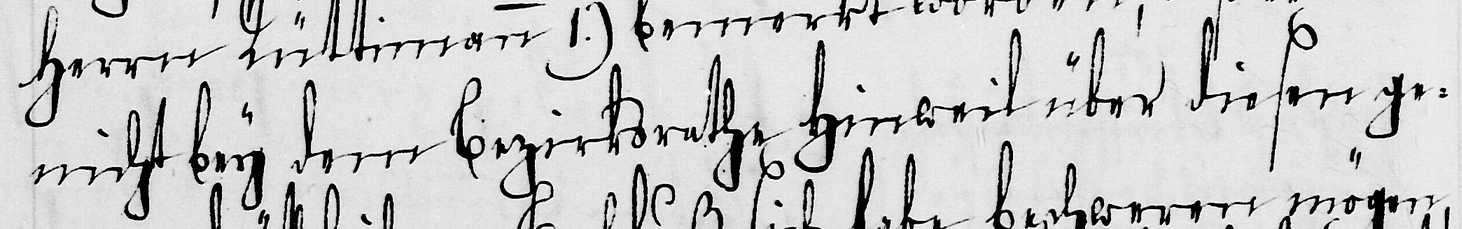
nicht bey dem Bezirksrathe Hinweil über diesen ge¬
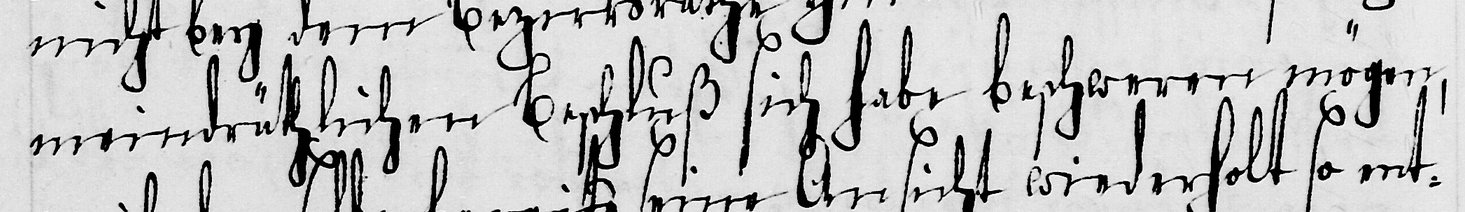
meindräthlichen Beschluß sich habe beschweren mögen,
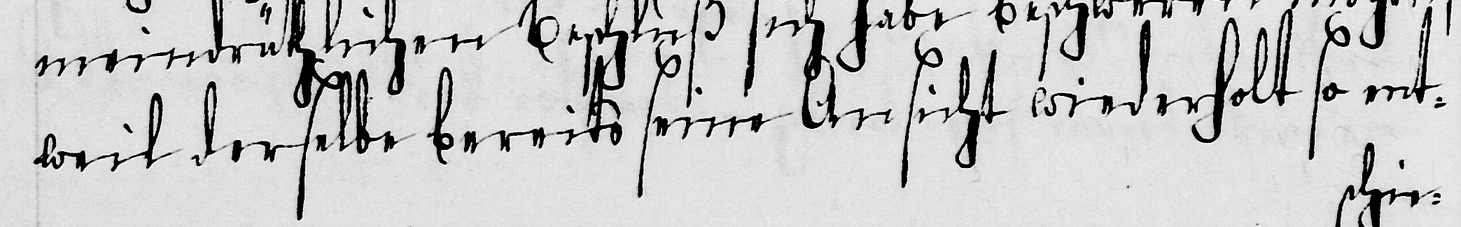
weil derselbe bereits seine Ansicht wiederholt so ent-
